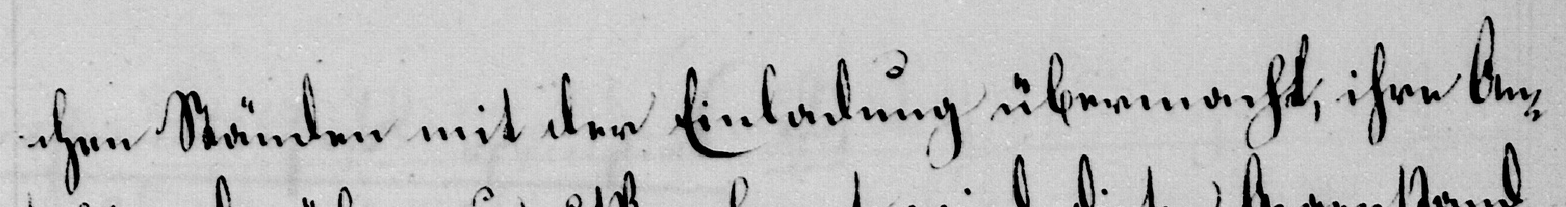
chen Ständen mit der Einladung übermacht, ihre An¬
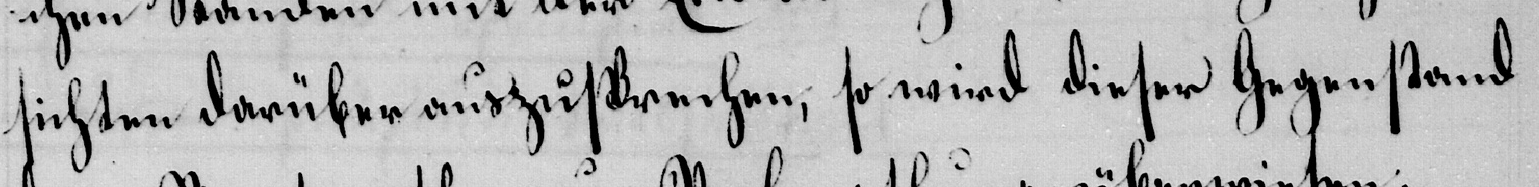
sichten darüber auszusprechen, so wird dieser Gegenstand
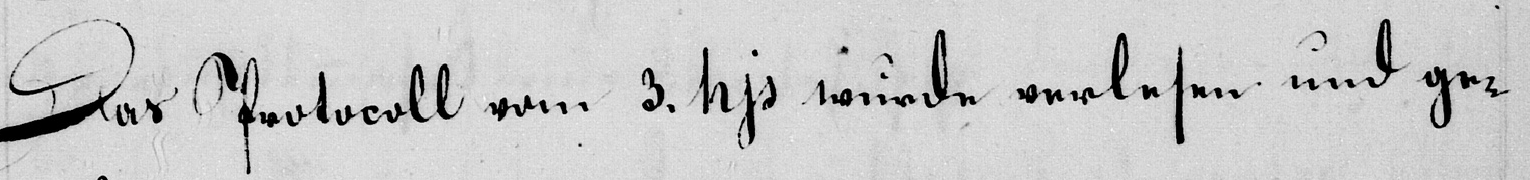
Das Protocoll vom 3. hjs wurde verlesen und ge¬
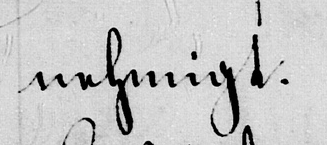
nehmigt.
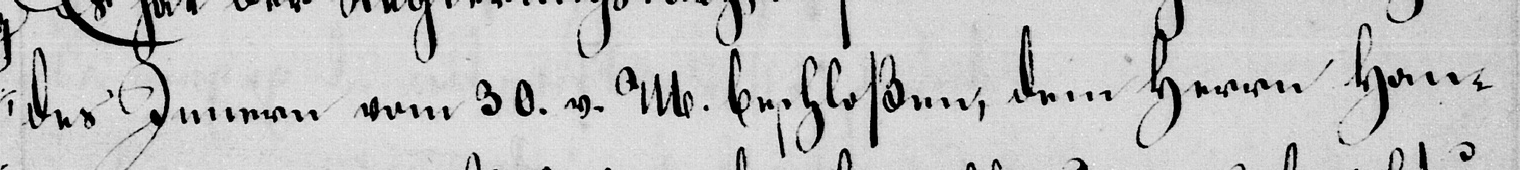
des Innern vom 30. v. M. beschloßen, dem Herrn Han¬
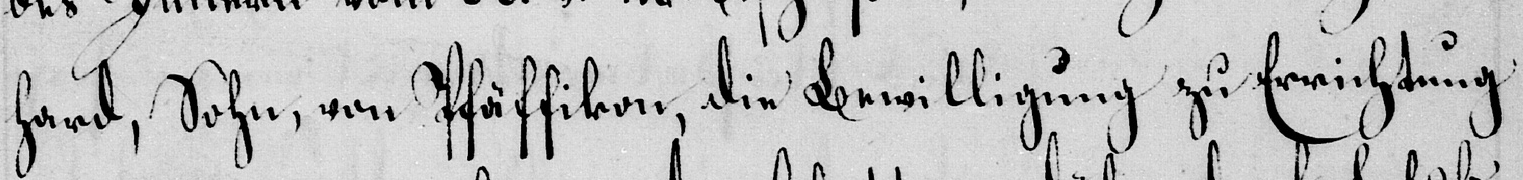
hard, Sohn, von Pfäffikon, die Bewilligung zu Errichtung
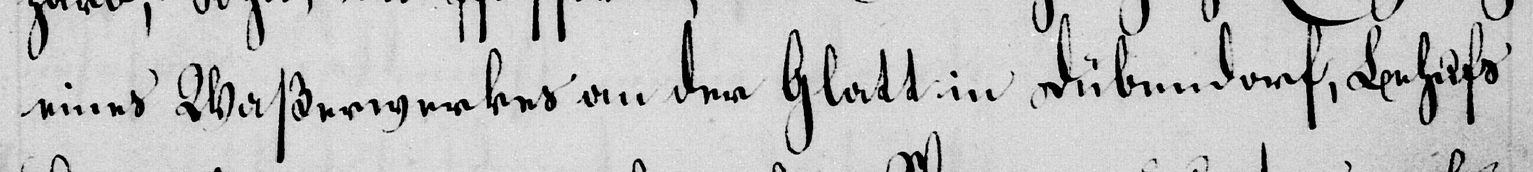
eines Waßerwerkes an der Glatt in Dübendorf, Behufs
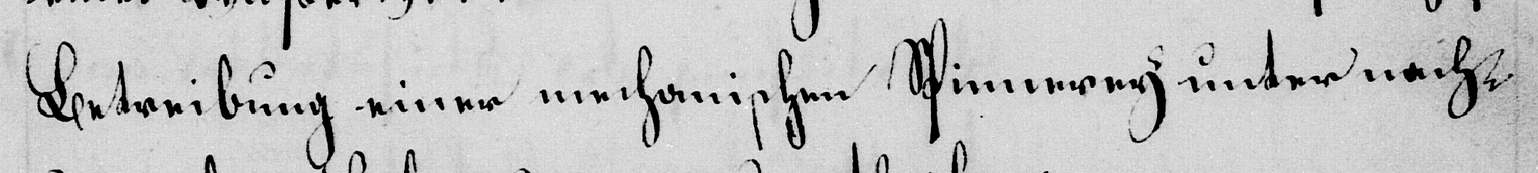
Betreibung einer mechanischen Spinnerey unter nachs¬
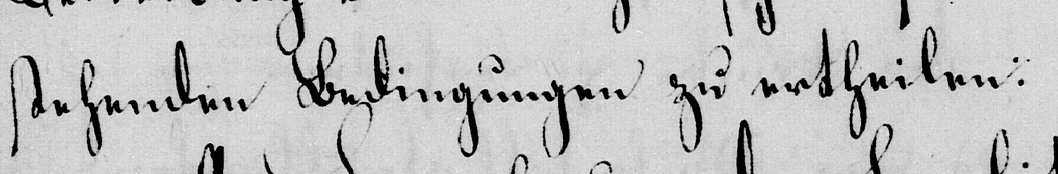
tehenden Bedingungen zu ertheilen:
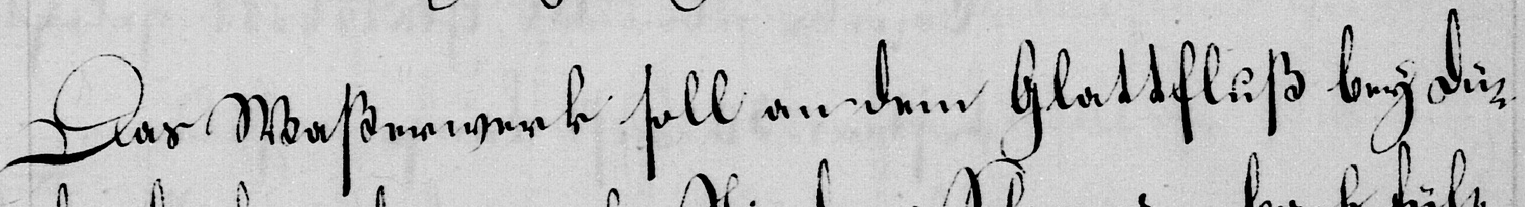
Das Waßerwerk soll an dem Glattfluß bey Dü¬
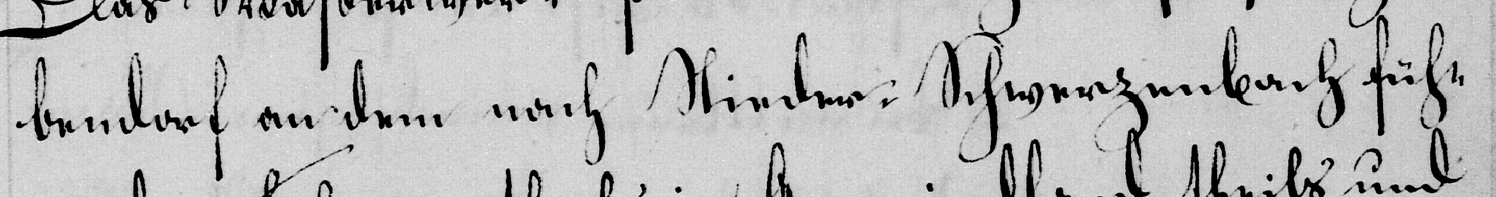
bendorf an dem nach Nieder-Schwerzenbach füh¬
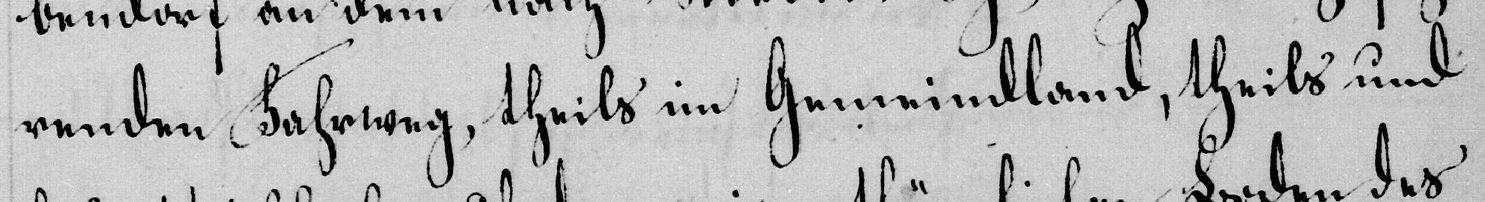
renden Fahrweg, theils im Gemeindland, theils und
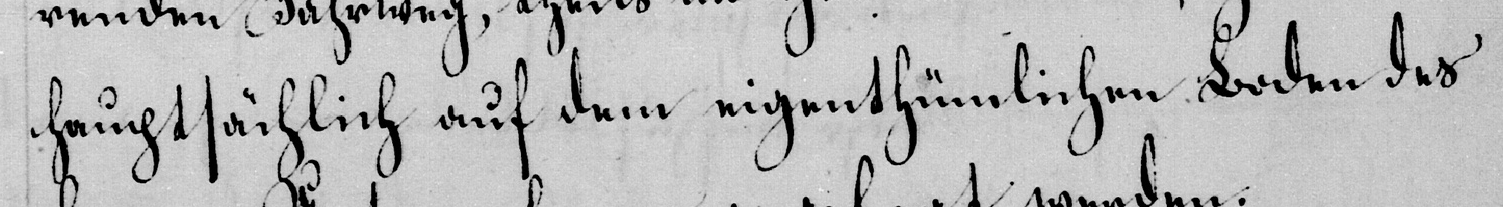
hauptsächlich auf dem eigenthümlichen Boden des
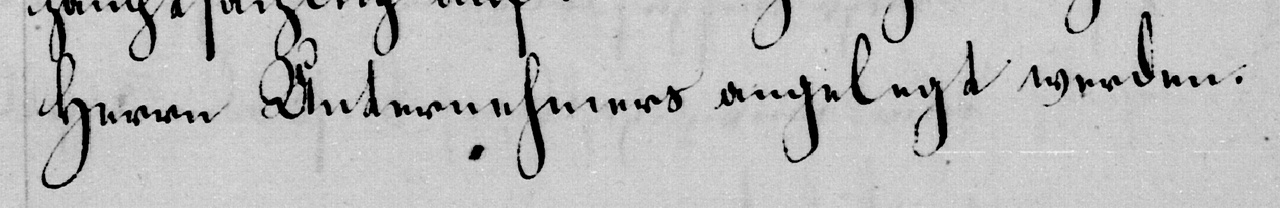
Herrn Unternehmers angelegt werden.
